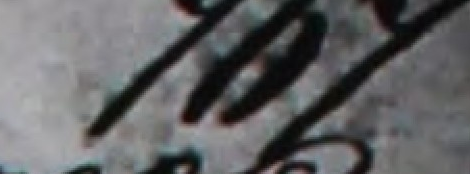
767
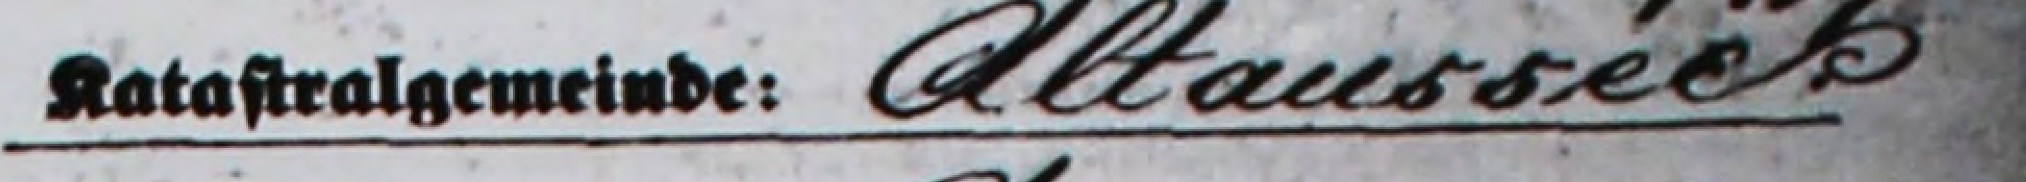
Katastralgemeinde: Altaussee
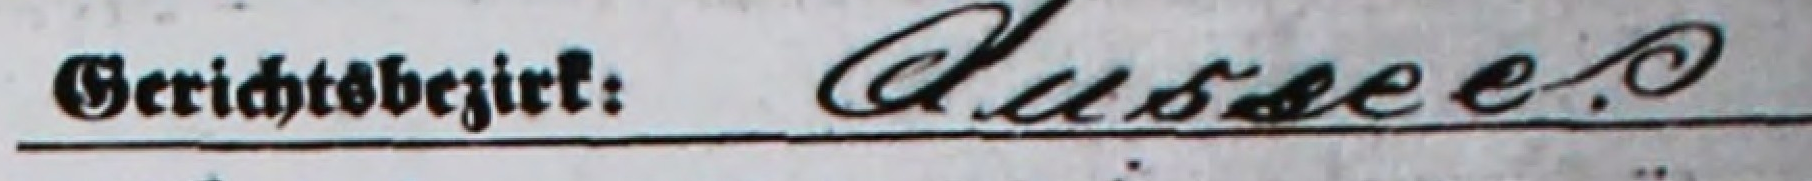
Gerichtsbezirk: Aussee
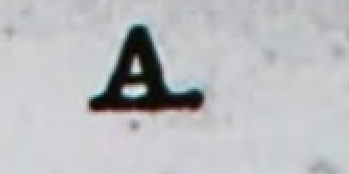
A.
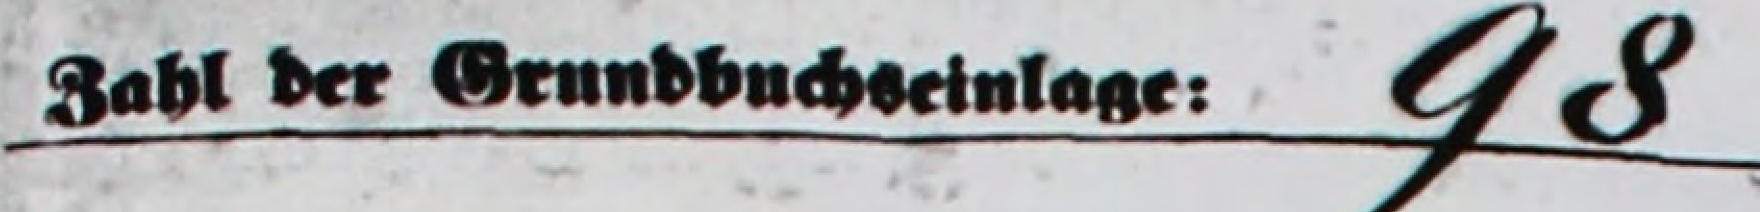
Zahl der Grundbuchseinlage; 98
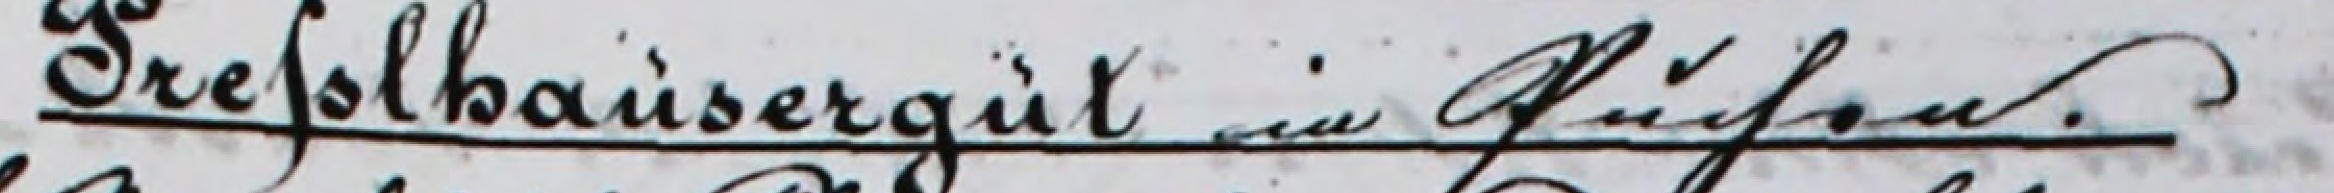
Presslbausergut in Puchen
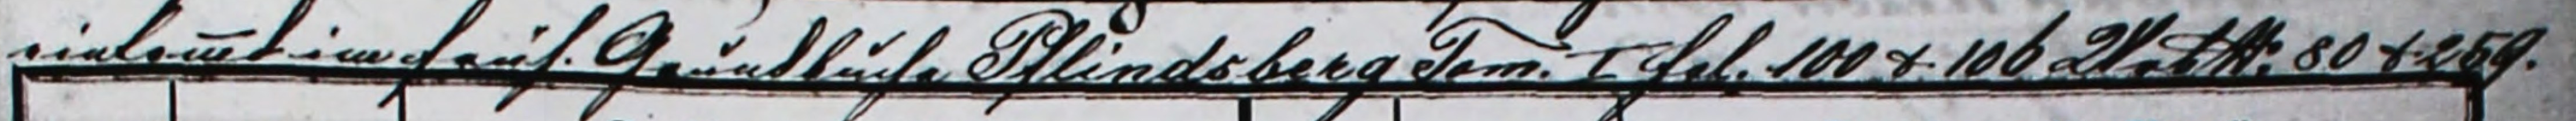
einkommt im früf. Grundbuche Pflindsberg Tom. I Hal. 100 & 106 Urb No. 80 & 259.
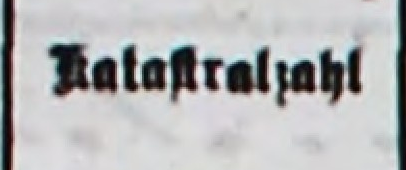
Katastralzahl
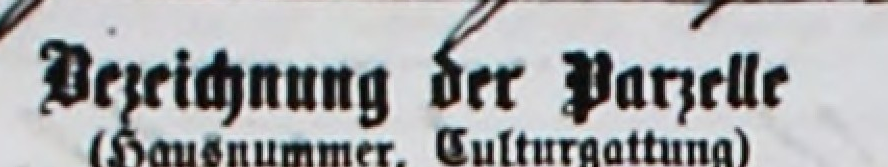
Bezeichnung der Parzelle
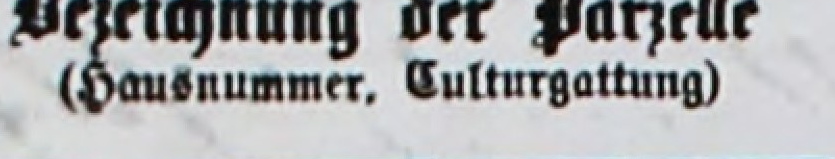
(Hausnummer, Culturgattung)
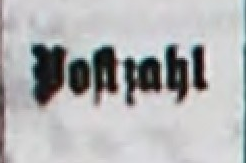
Postzahl
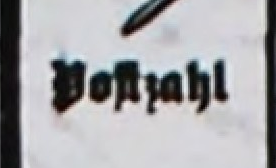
Postzahl
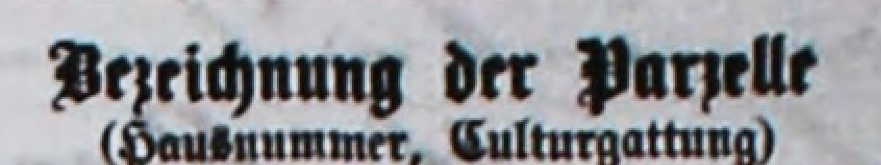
Bezeichnung der Parzelle
